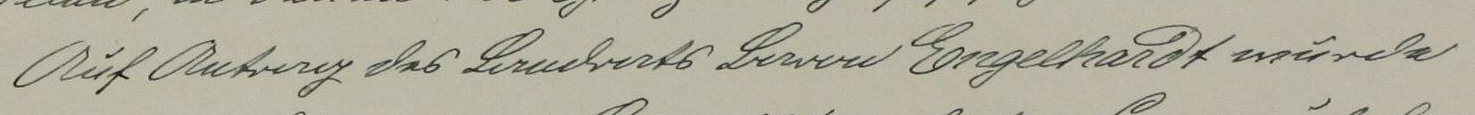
Auf Antrag des Landrats Baron Engelhardt wurde
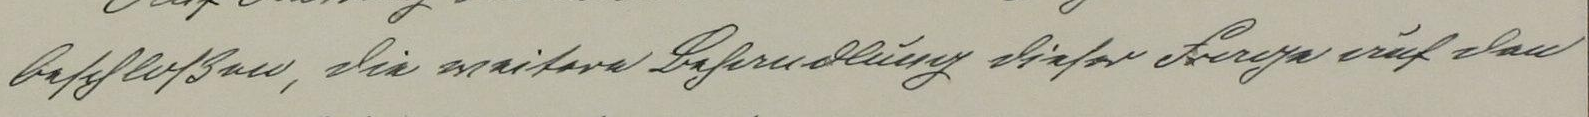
beschloßen, die weitere Behandlung dieser Frage auf den
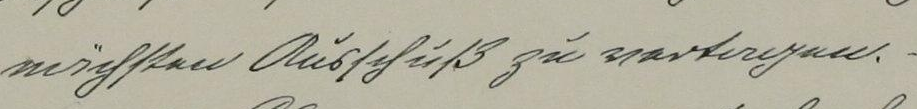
nächsten Ausschuß zu vertagen.
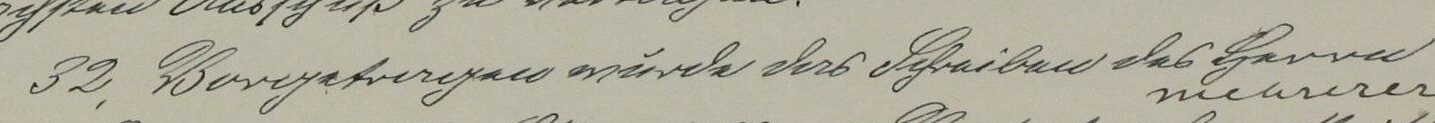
32. Vorgetragen wurde das Schreiben des Herrn
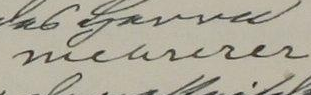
mehrerer
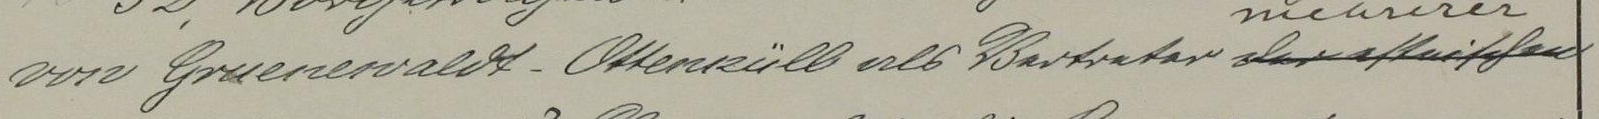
von Gruenewaldt-Ottenküll als Vertreter der estnischen
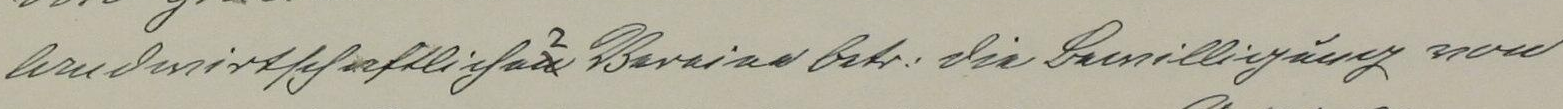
landwirtschaftlichenr Vereine betr. die Bewilligung von
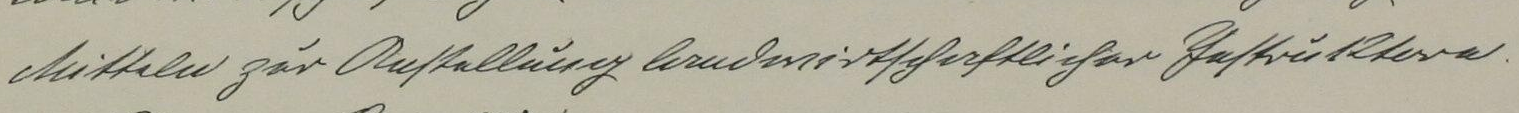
Mitteln zur Anstellung landwirtschaftlicher Instruktore
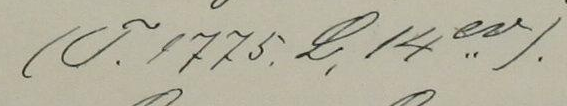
(T.1775; L.14ev).
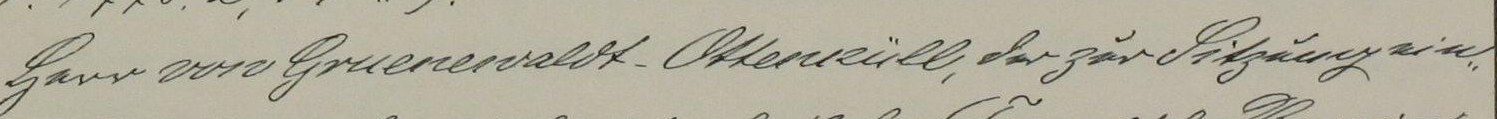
Herr von Gruenewaldt-Ottenküll, der zur Sitzung ein-
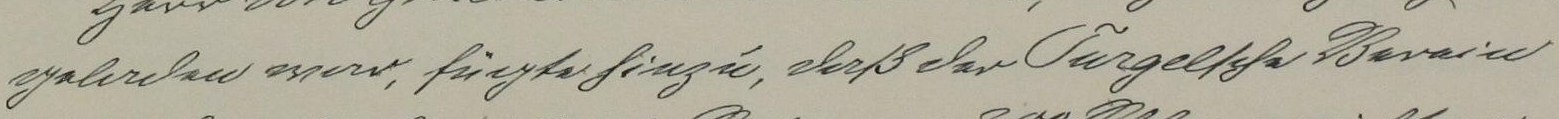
geladen war, fügte hinzu, daß der Turgelsche Verein
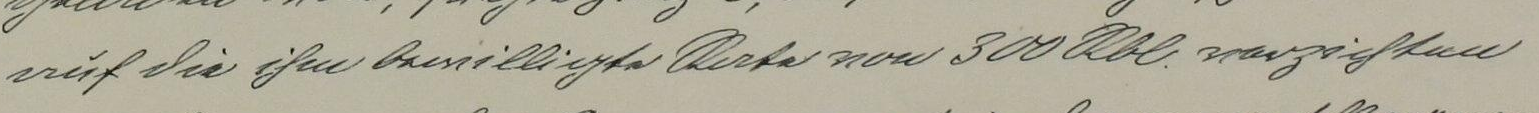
auf die ihm bewilligte Rate von 300 Rbl. verzichten
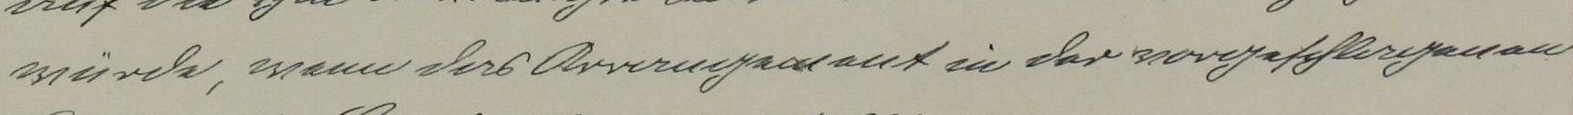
würde, wenn das Arrangement in der vorgeschlagenen
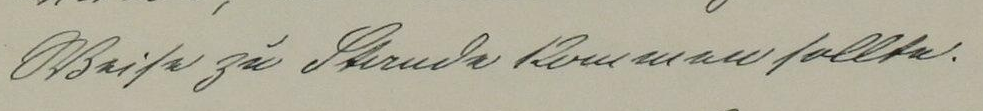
Weise zu Stande kommen sollte.
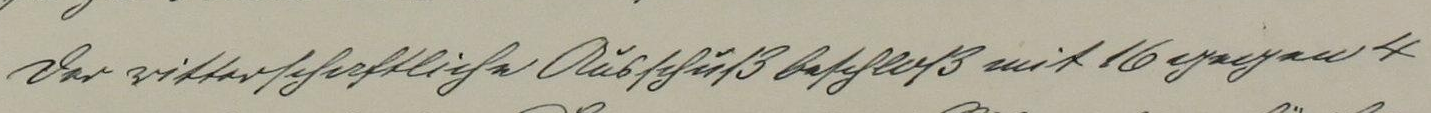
Der ritterschaftliche Ausschuß beschloß mit 16 gegen 4
